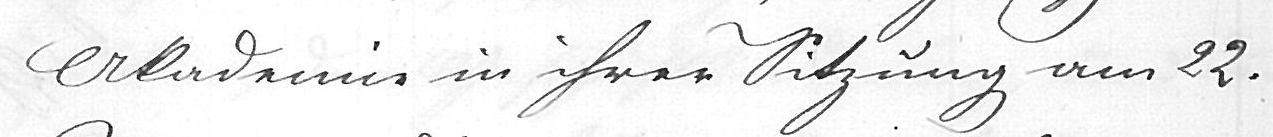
Akademie in ihrer Sitzung am 22.
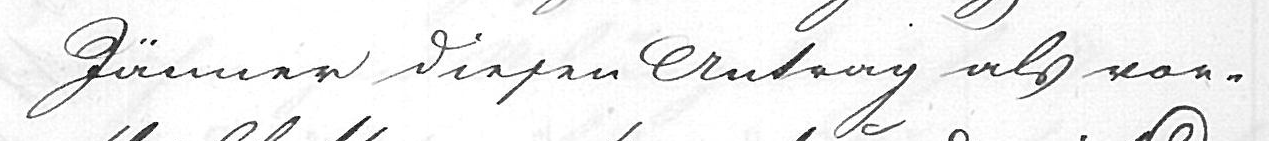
Jänner diesen Antarg vor
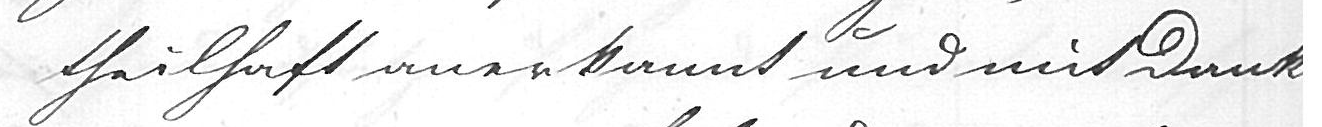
theilhaft anerkannt und mit Dank
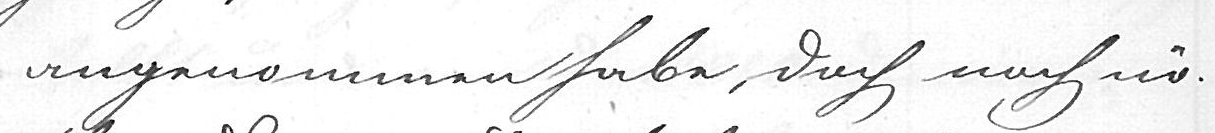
angenommen habe, doch noch nö-
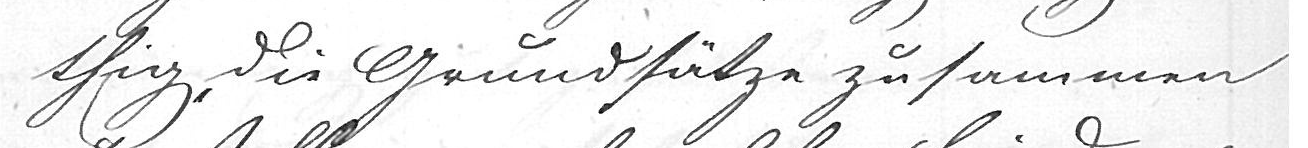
thig, die Grundsätze zusammen
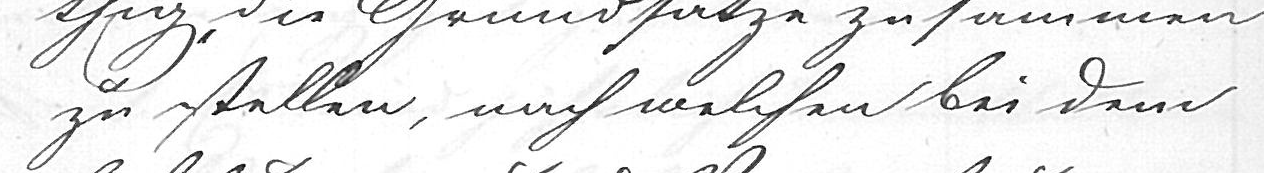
zu stellen, nach welchen bei dem
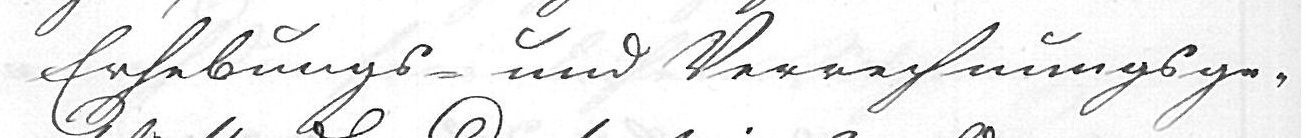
Erhebungs- und Verrechnungsge-
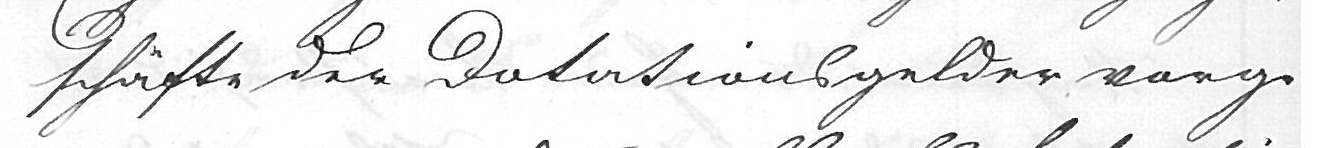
schäfte der Dotationsgelder vorge.
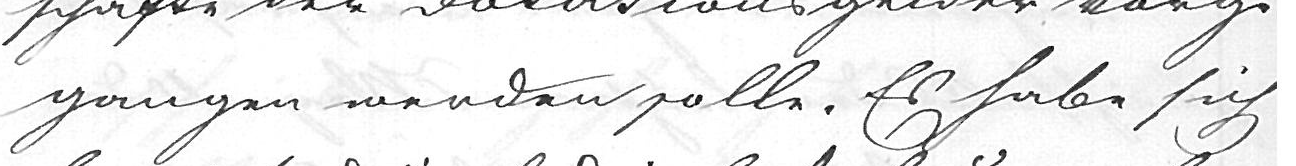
gangen werden solle. Es habe sich
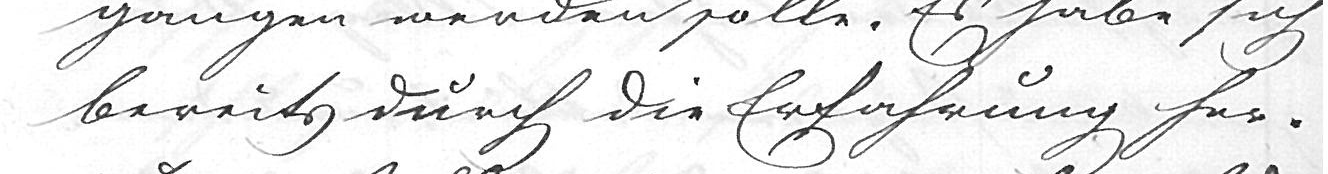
bereits durch die Erfahrung her-
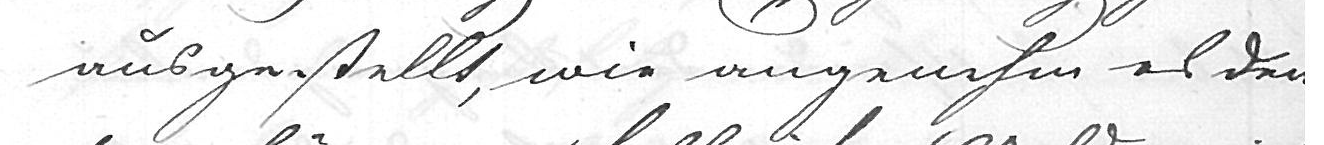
ausgestellt, wie angenehm es den
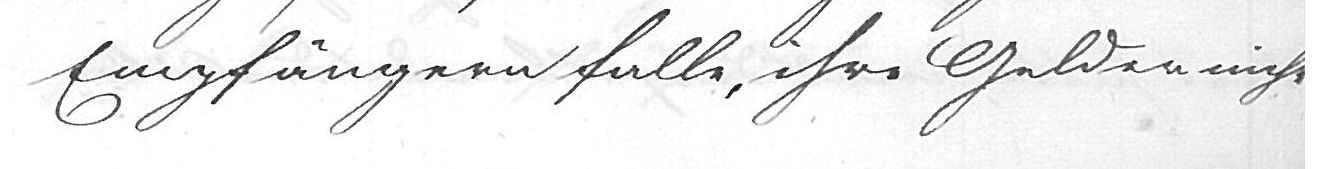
Empfängern falle, ihre Gelder nicht
